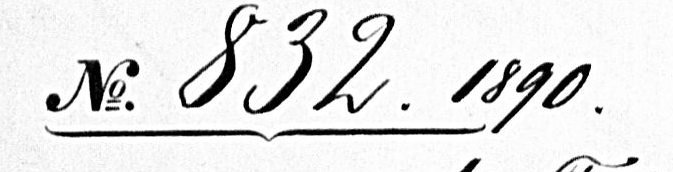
N° 832.1890.
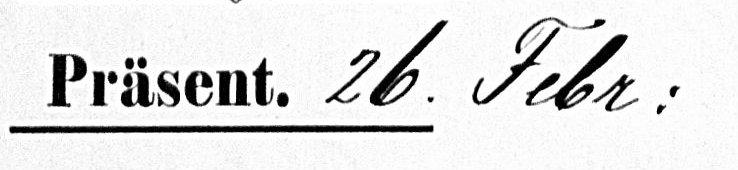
Präsent. 26. Febr:
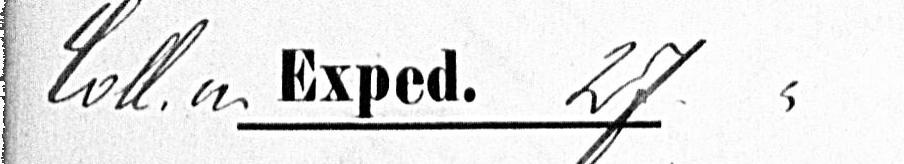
Coll. u.Exped. 27Febr:
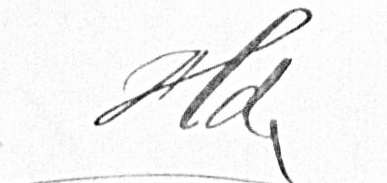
Hd
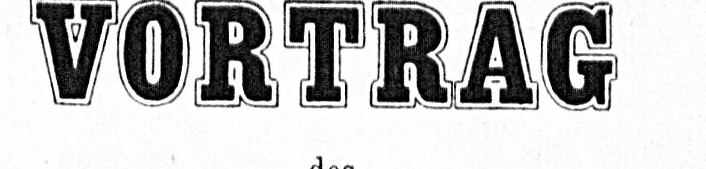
VORTRAG
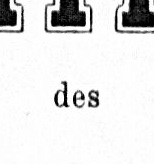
des
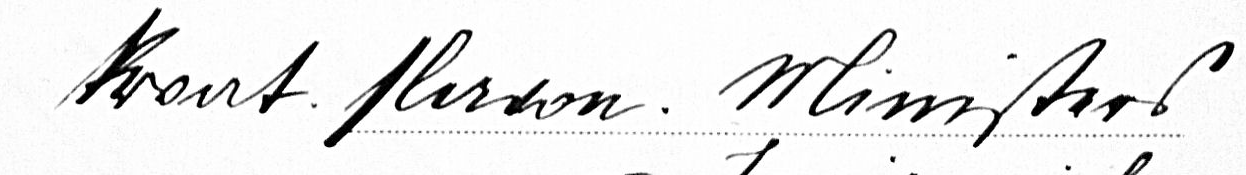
kroat. slawn. Ministers
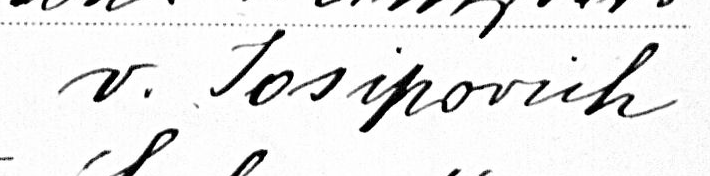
v. Josipovich
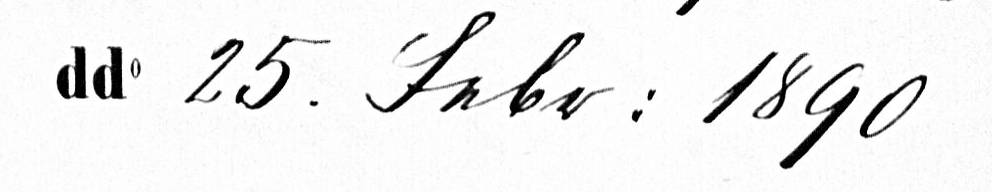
dd° 25. Febr: 1890
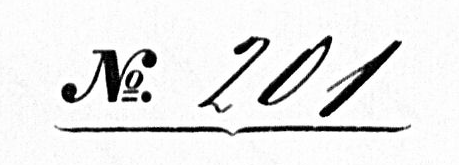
N° 201
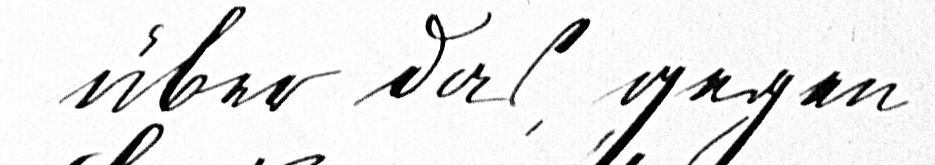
über das, gegen
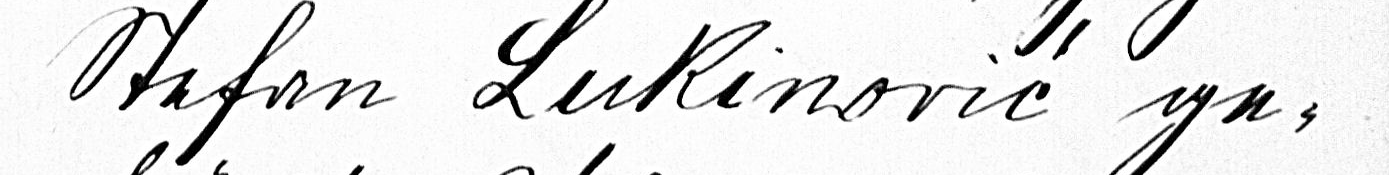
Stefan Lukinović ge¬
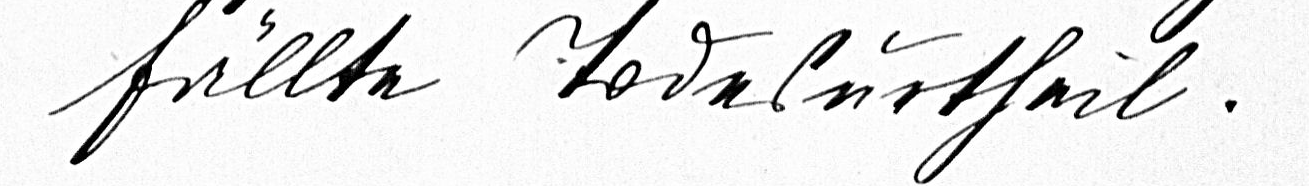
fällte Todesurtheil.
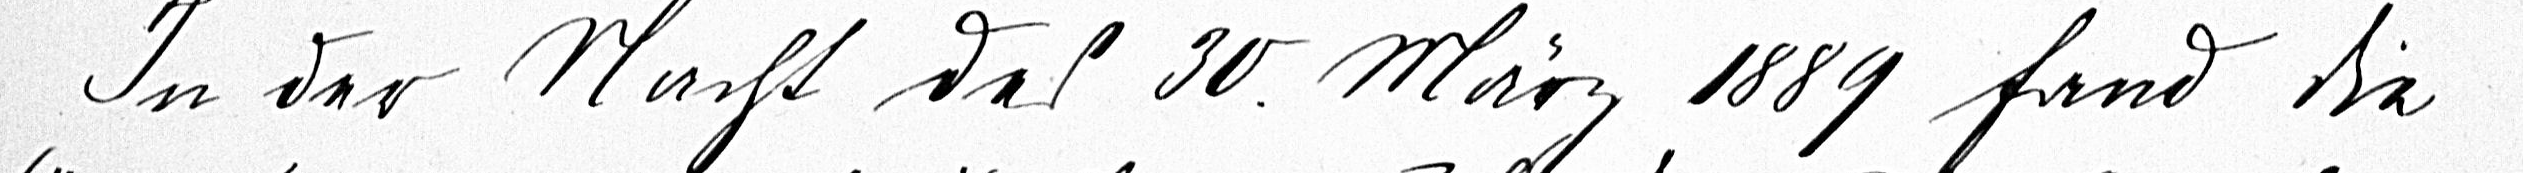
In der Nacht des 30. März 1889 fand die
